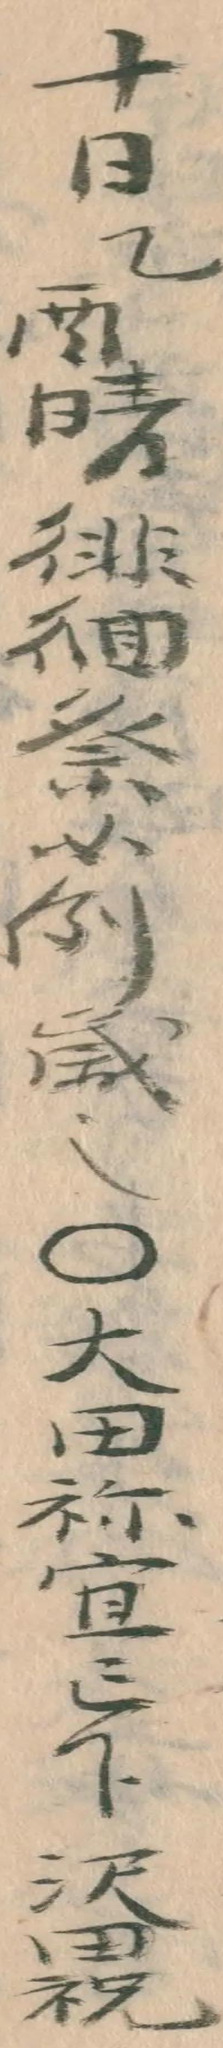十日乙酉晴徘徊祭如例歳也○大田称宜已下沢田祝
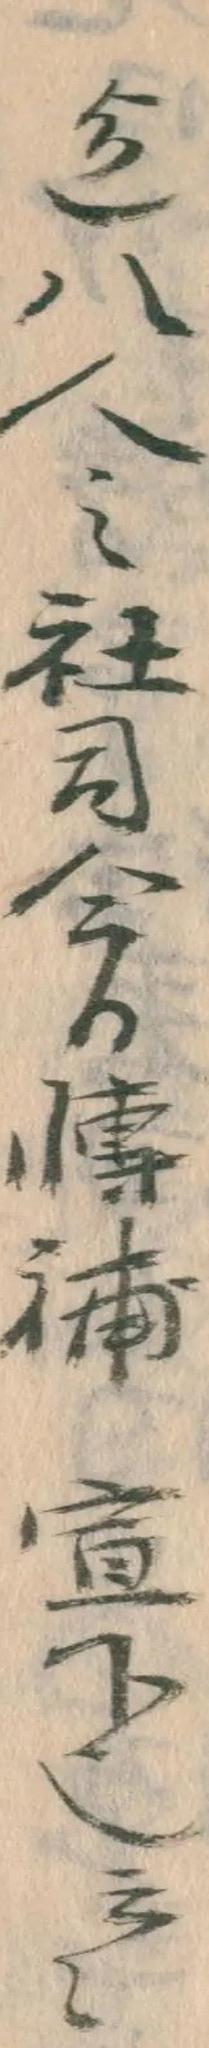迄八人之社司今日轉補宣下也云々
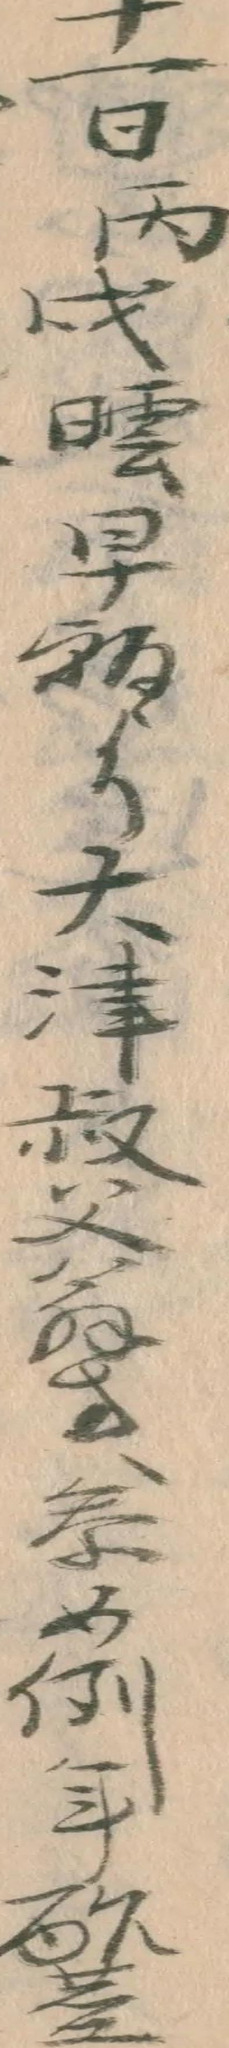十一日丙戌晴日朝より大津叔父翁方へ参如例年酢茎
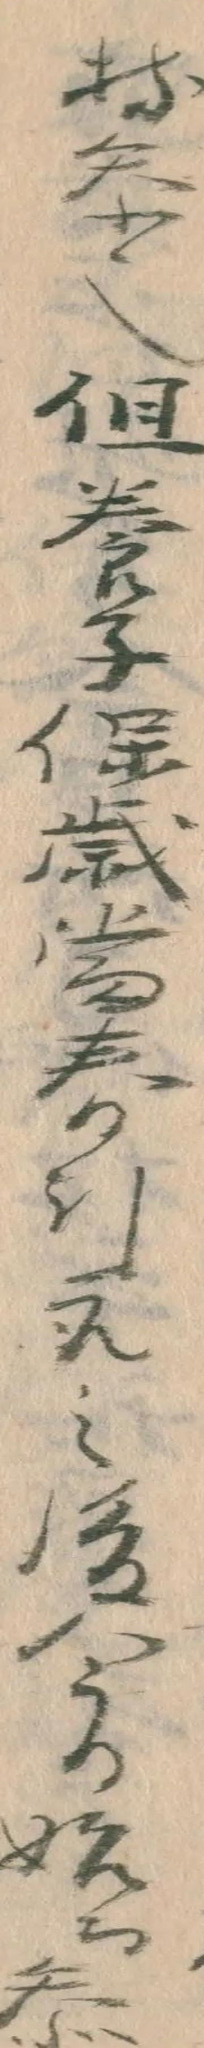持参也但養子保歳當春引取之後今日始而参
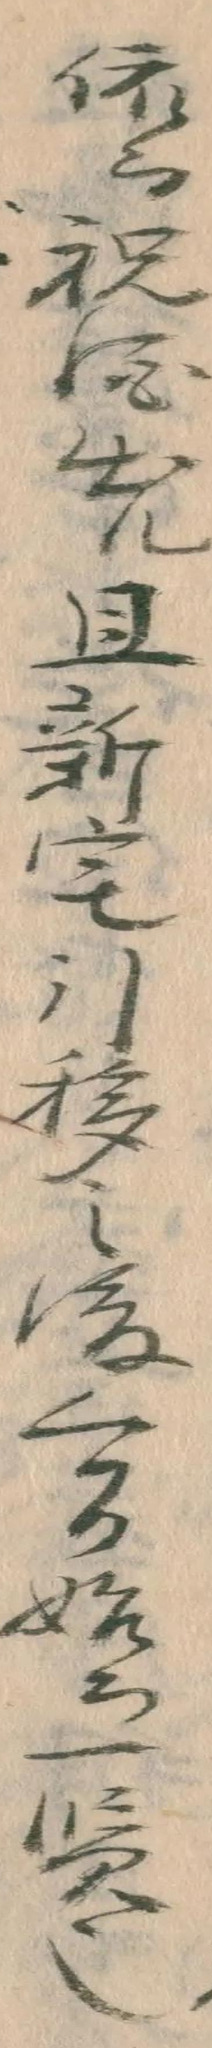依而祝儀出ル且新宅引移之後今日始而一覧也
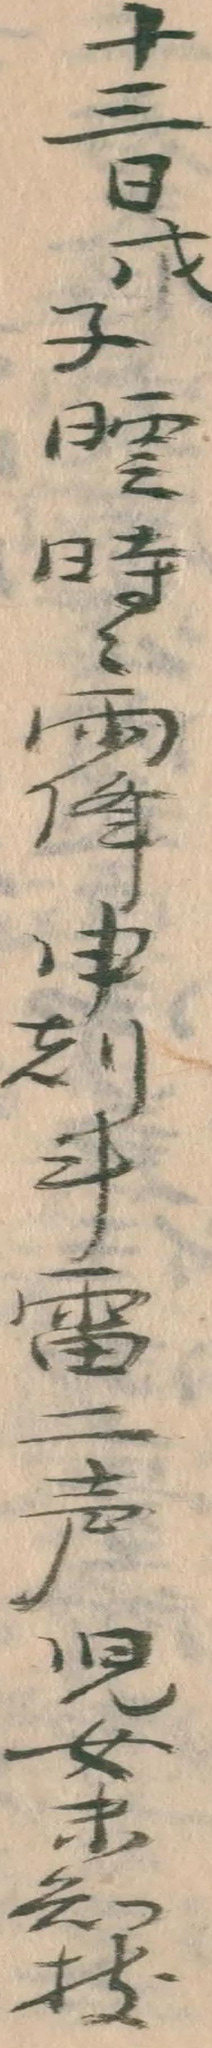十三日戊子雲時々雨降申刻斗雷二声児女未知枝
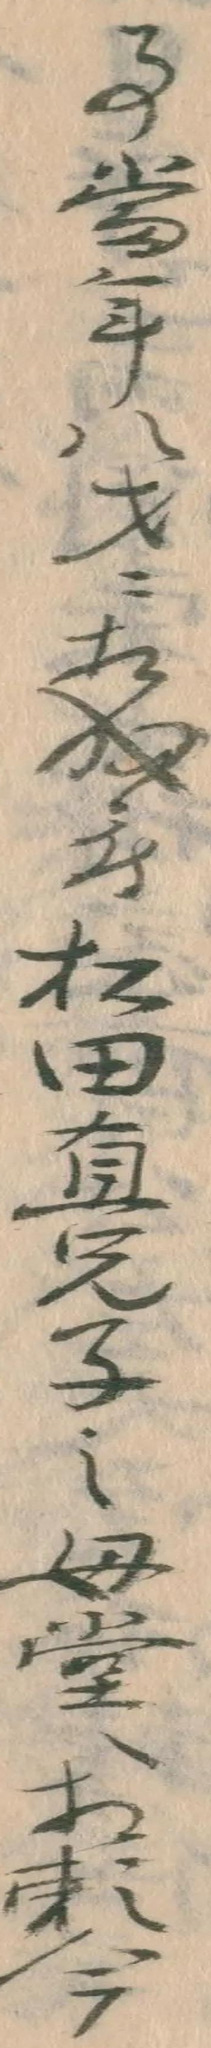事當年八才ニ相成ニ付松田直兄子之母堂へ相頼今
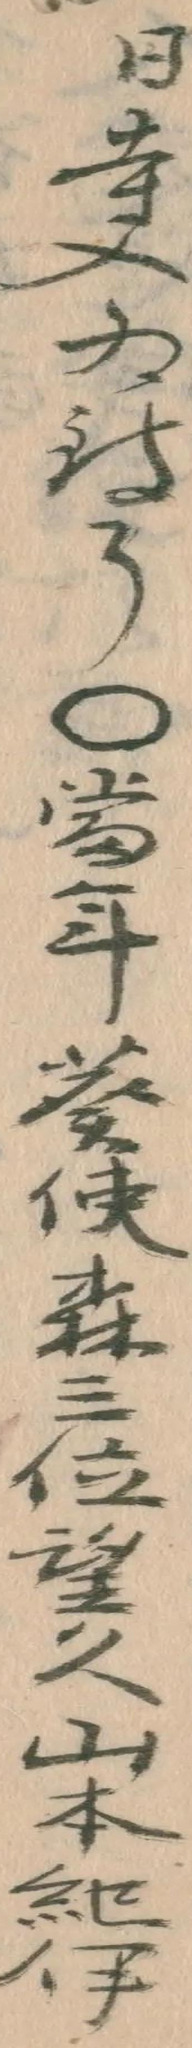日寺入為致了○當年葵使森三位望久山本紀伊
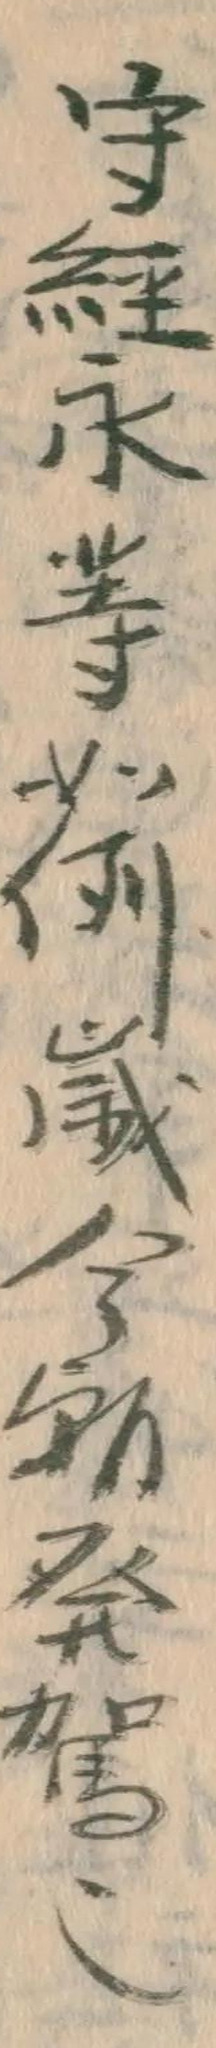守経永等如例歳今朝発駕也
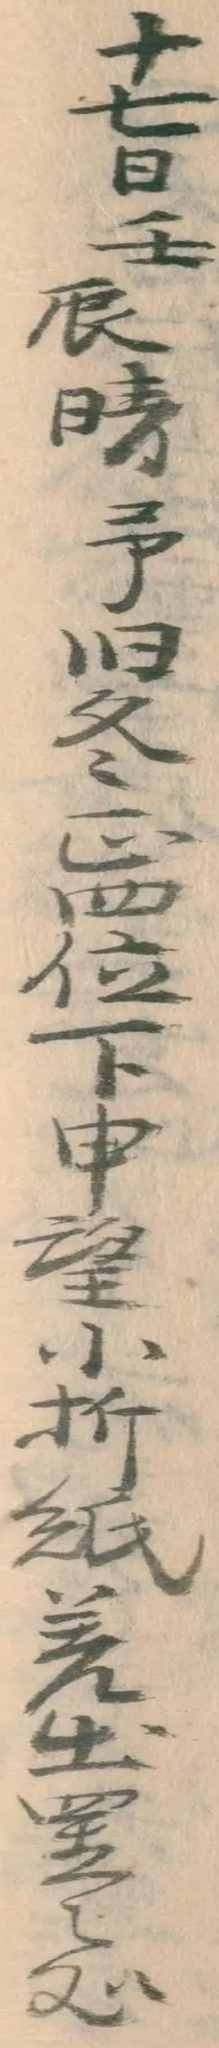十七日壬辰晴予旧冬正四位下申望小折紙差出置之処
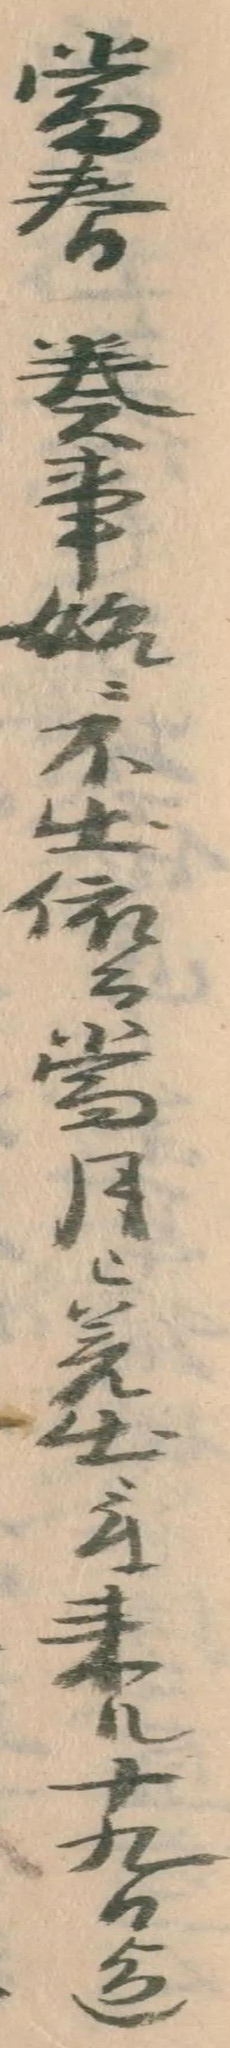當春奏事始ニ不出依而當月被差出ニ付来ル十九日迄
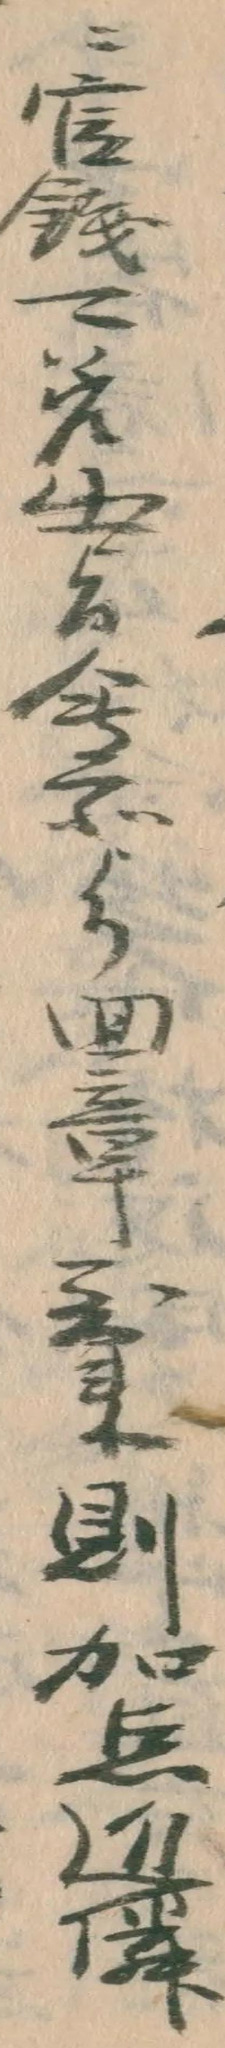二官銭可差出旨會所より回章到来則加点近隣
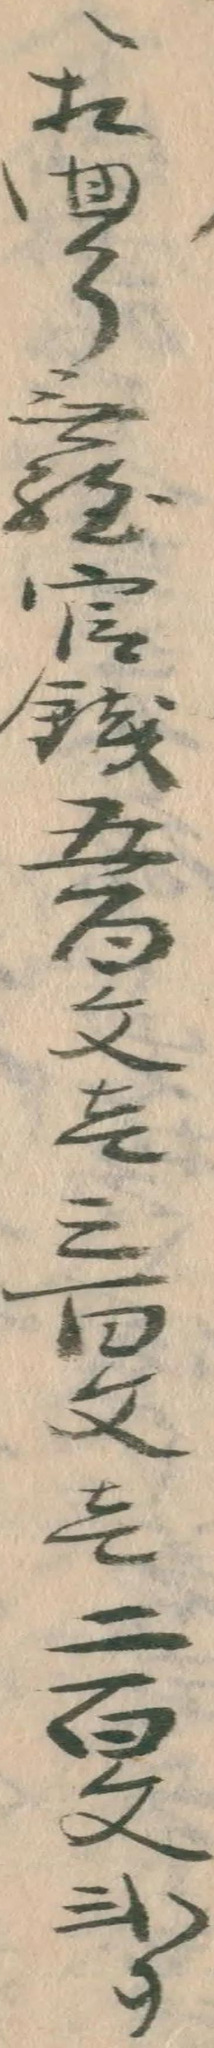へ相回了無程官銭五百文壱三百文銭壱二百文弐匁
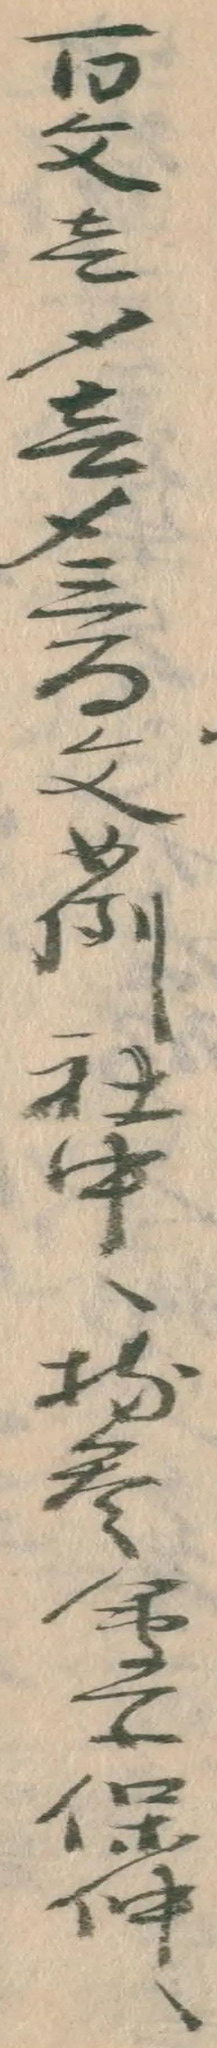百文壱〆壱〆三百文如例社中へ持参會所保仲へ
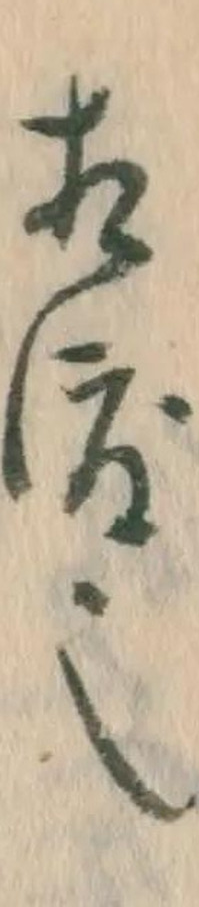相渡也
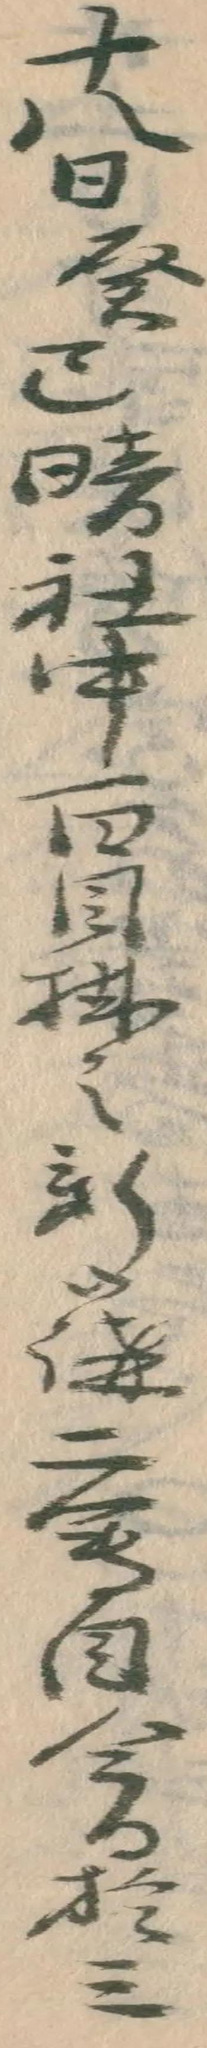十八日癸巳晴社中百目払之新御溝二會自今日於三
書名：賀茂社記録. 第63冊
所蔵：国立国会図書館 National Diet Library, JAPAN
